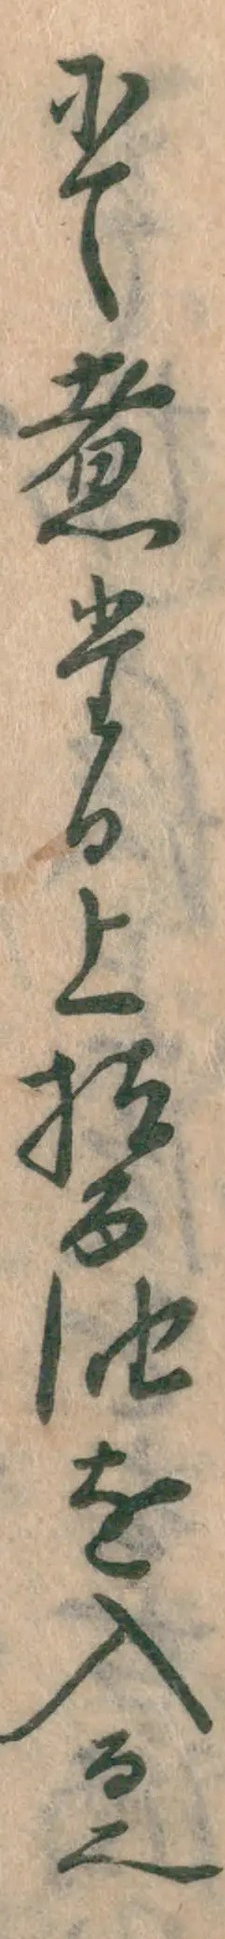にて煮たる上醤油を入る也
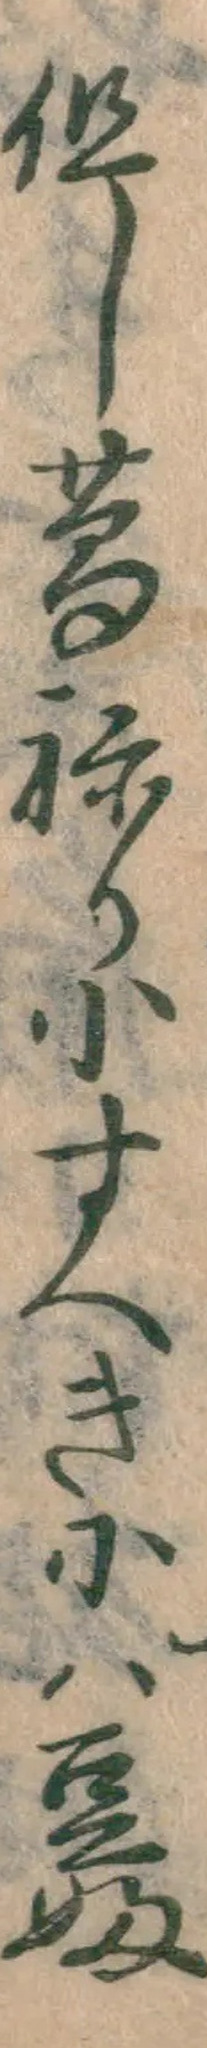但し葛ねりにすへきには豆ふ
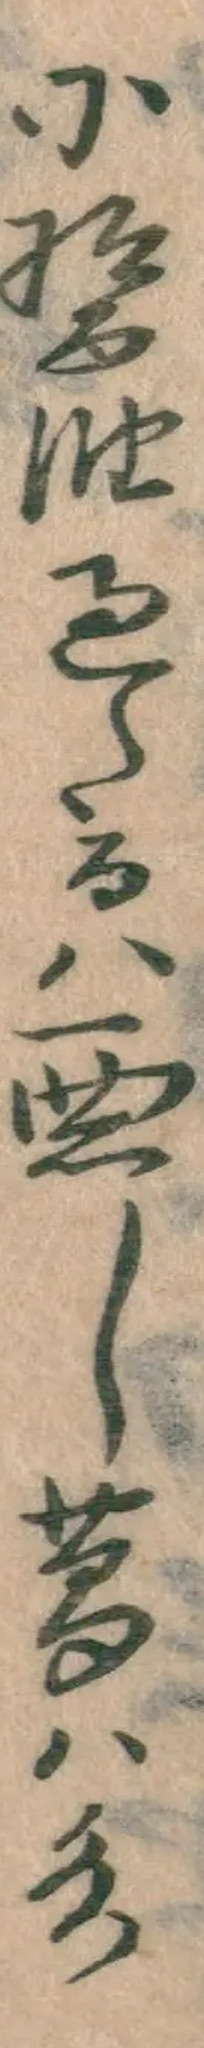に醤油過たるは悪し葛は水
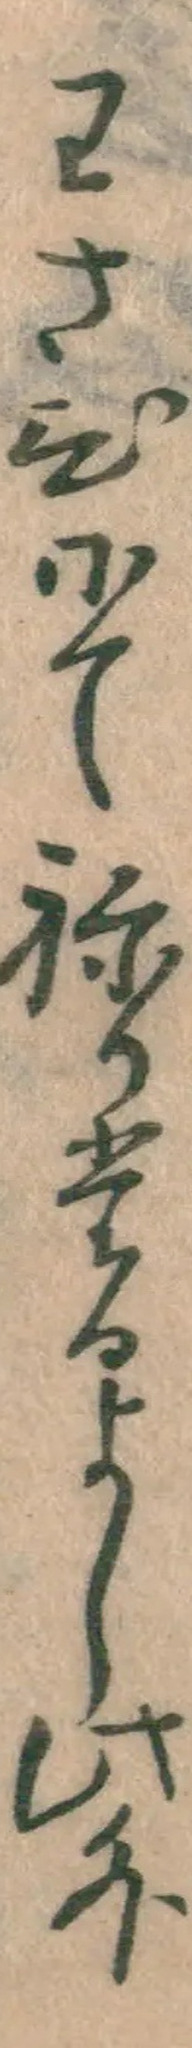わさびにてねりたるよし此外
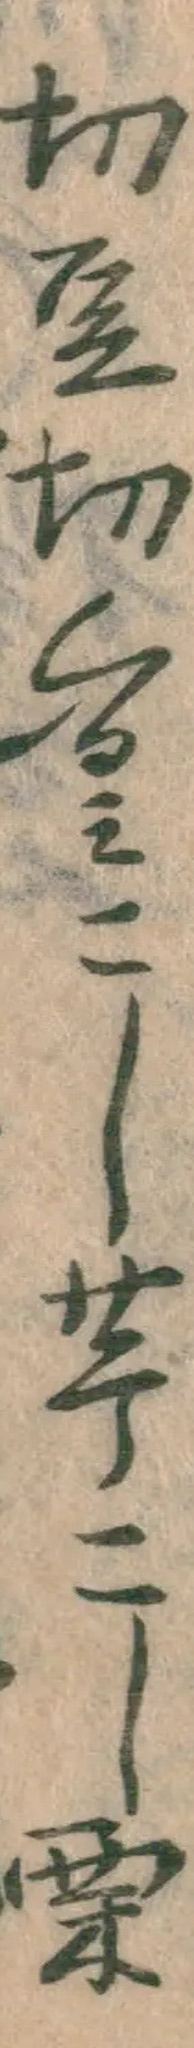切豆切くるみこし芋こし栗
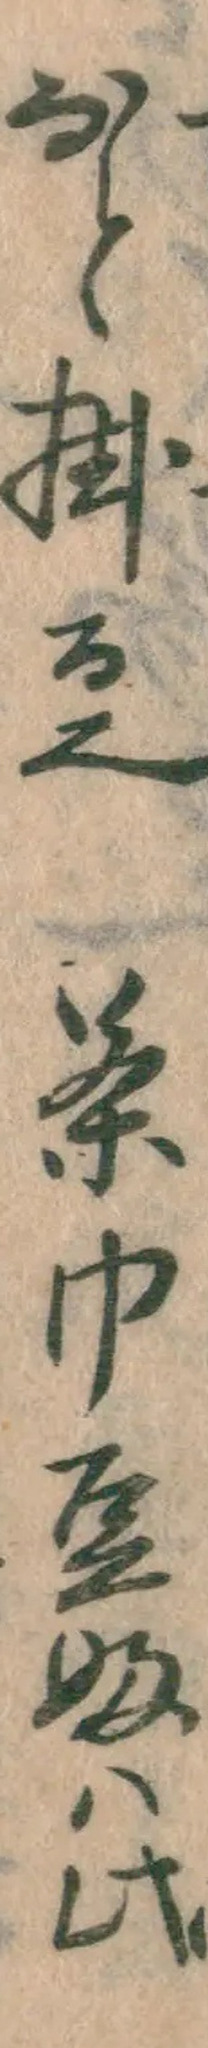なと掛る也茶巾豆ふは此
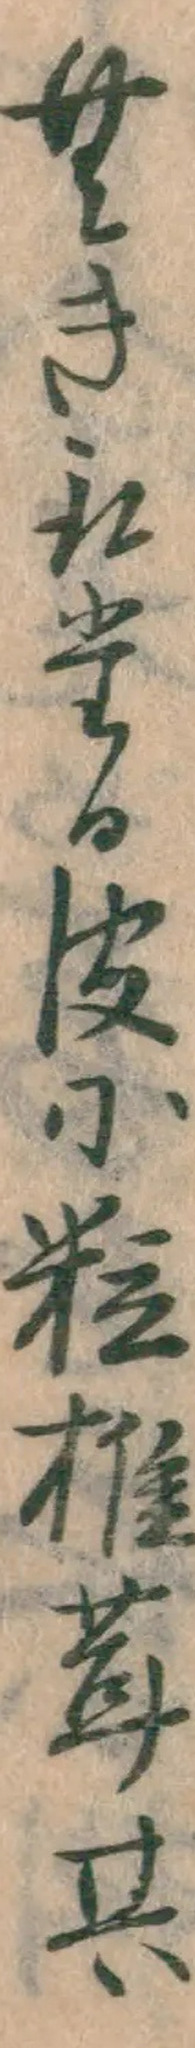むき取たる皮に粒椎茸其
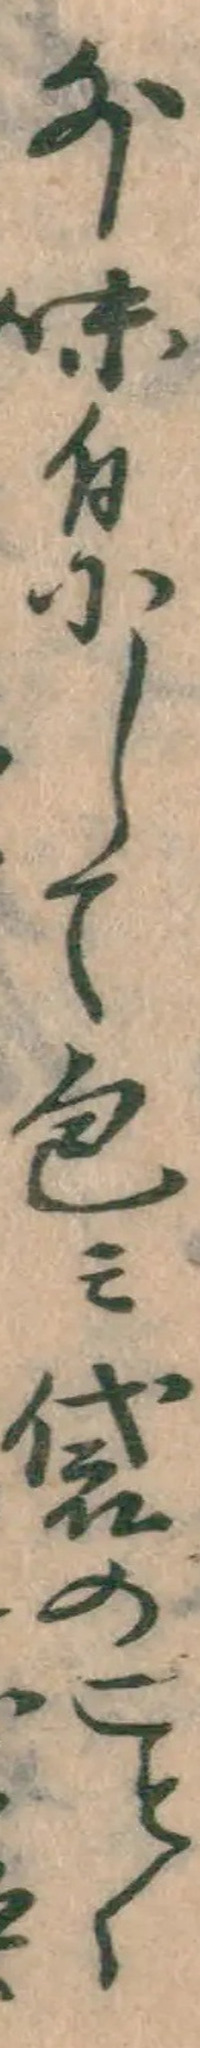外味付にして包み袋のことく
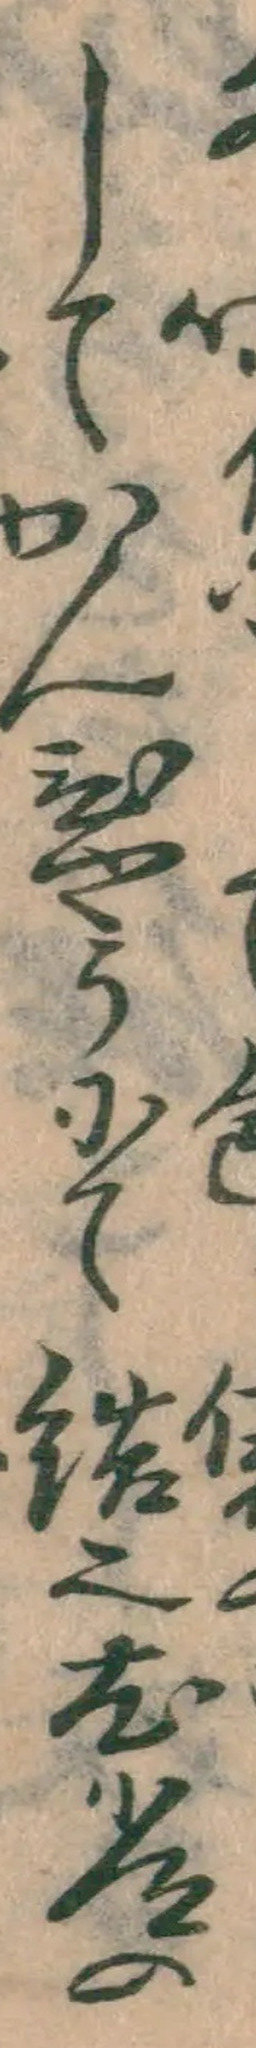してかんひやうにて結也尤常の
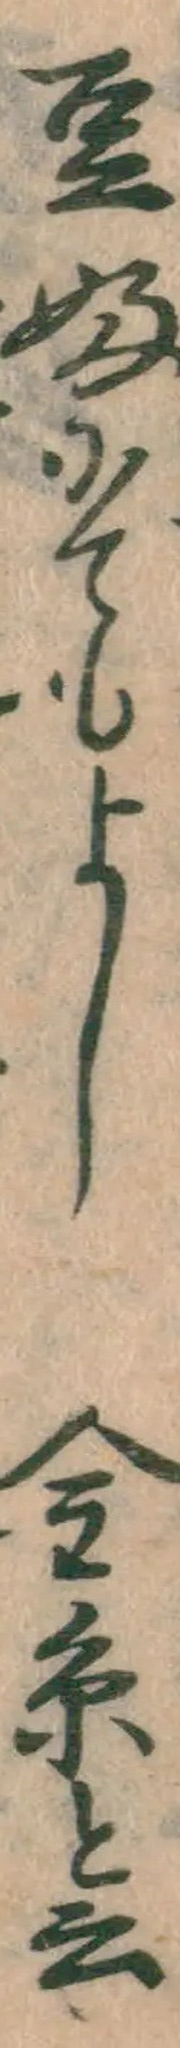豆ふにてもよし金糸と云
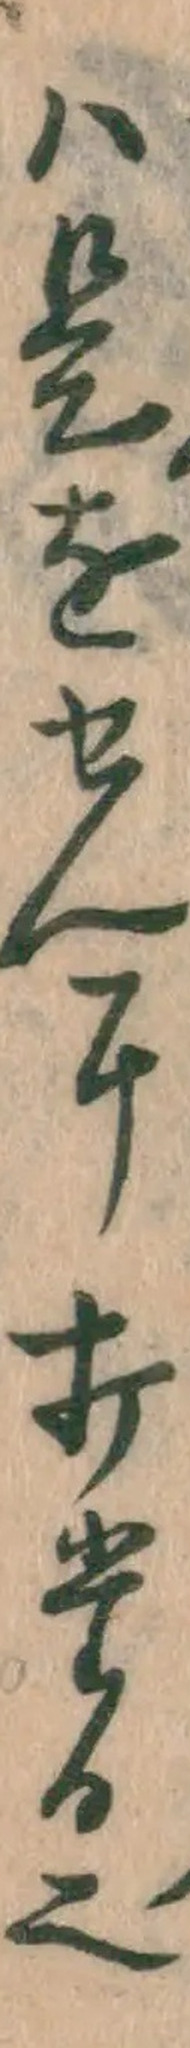は是をせんに打たる也
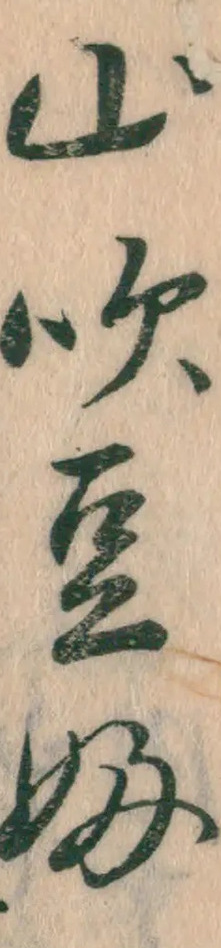山吹豆ふ
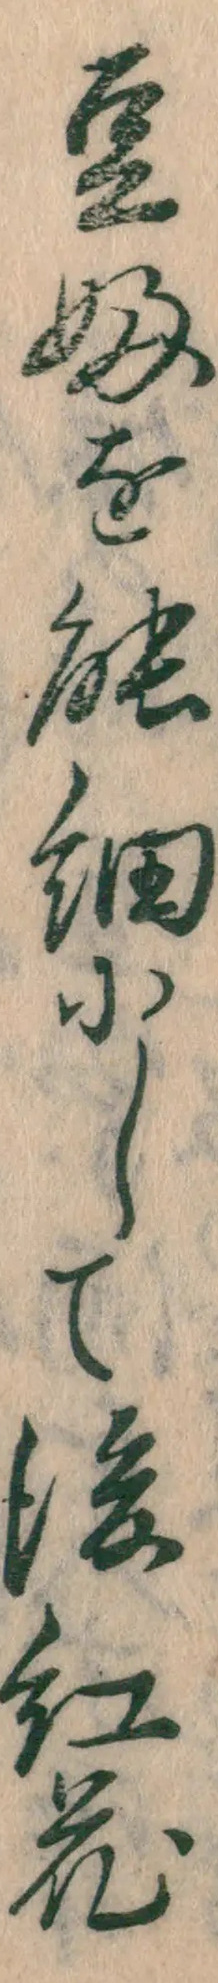豆ふを能細にして後紅花
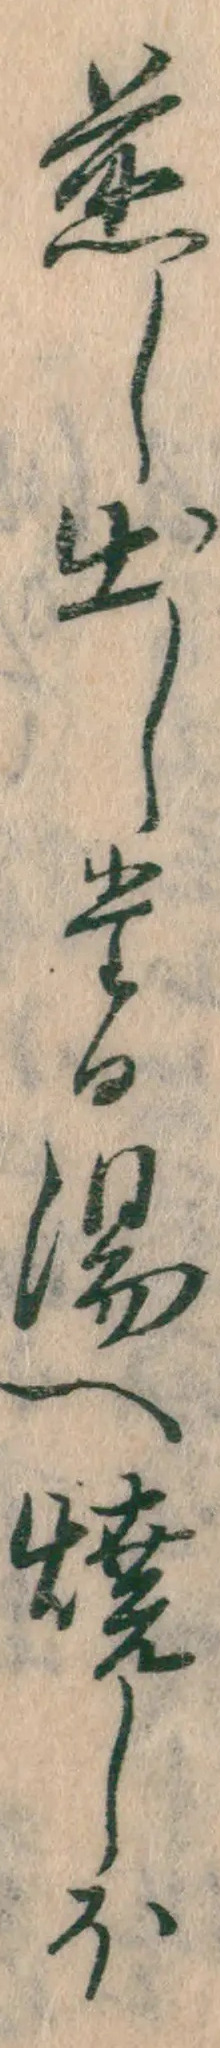煎し出したる湯へ焼しほ
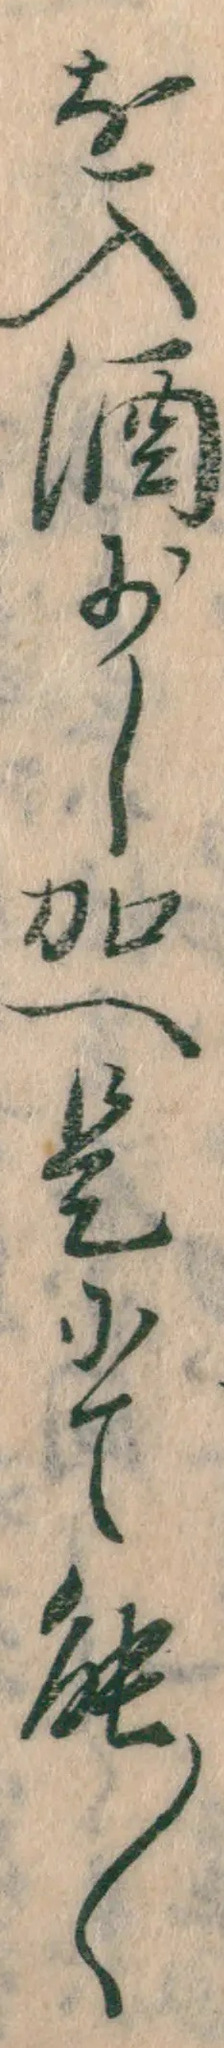を入酒少し加へ是にて能〳〵
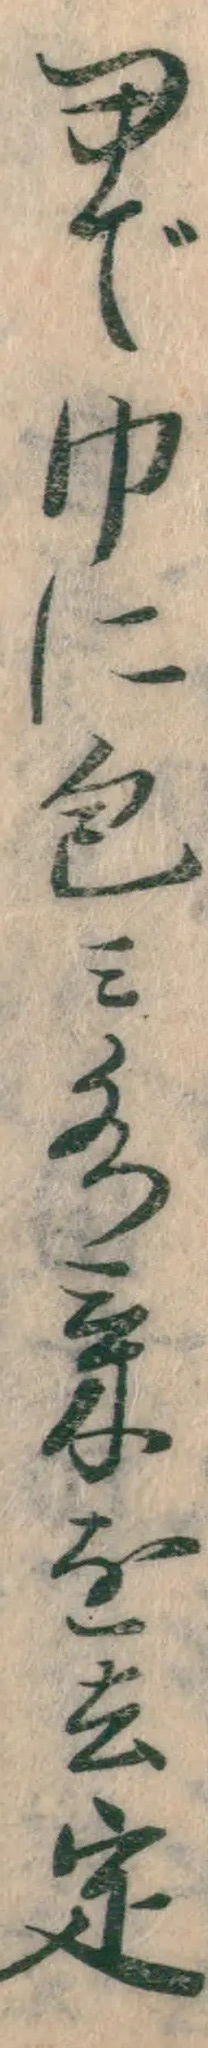ゆで巾に包み水気を去定
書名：豆腐百珍余録
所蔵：国立国会図書館 National Diet Library, JAPAN
